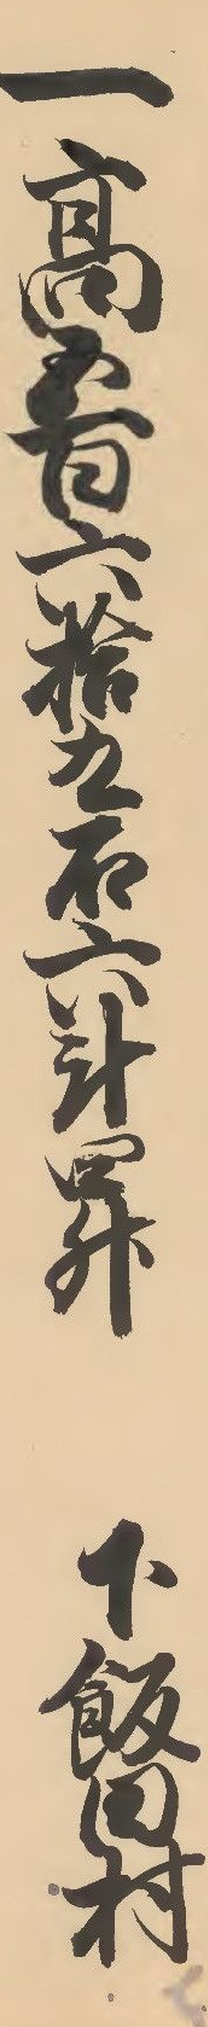一高五百六拾九石六斗四升下飯田村
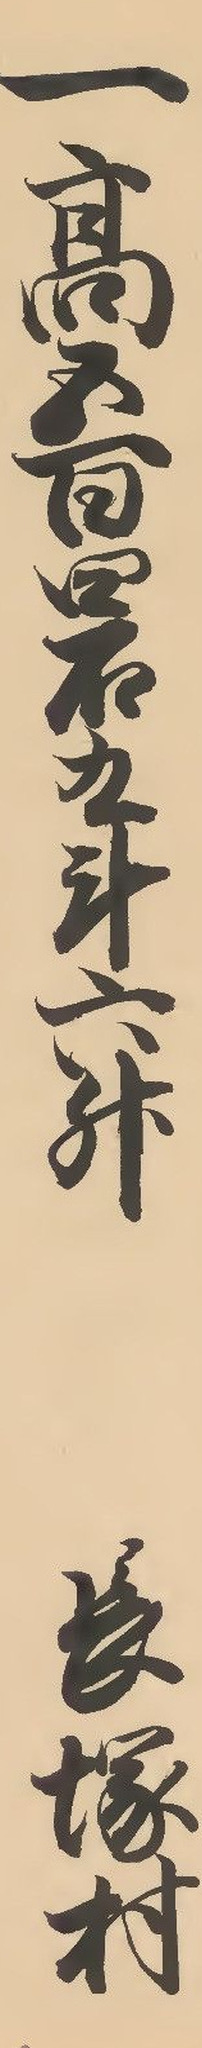一高五百四石九斗六升長塚村
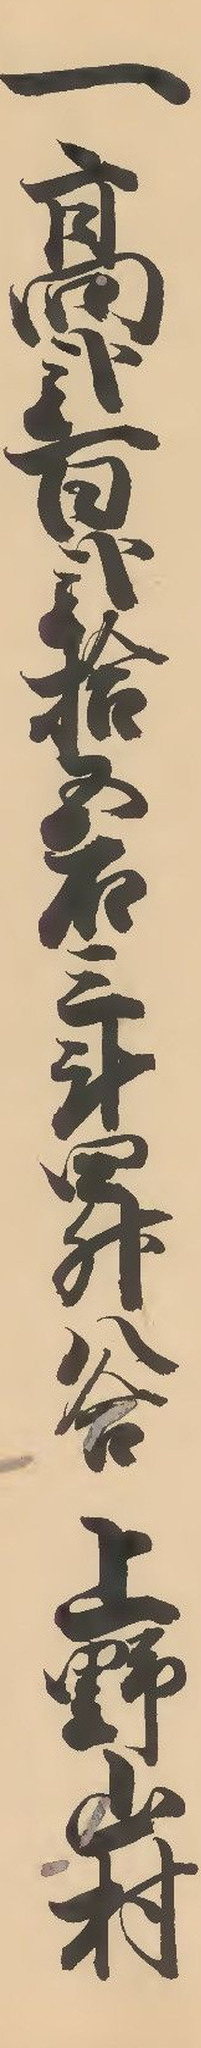一高弐百弐拾五石三斗四升八合上野山村

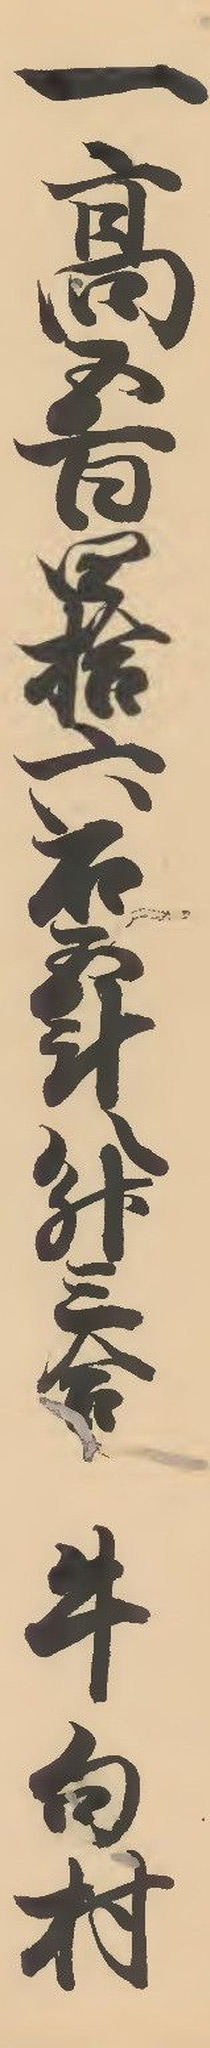一高五百四拾六石五斗八升三合牛句村
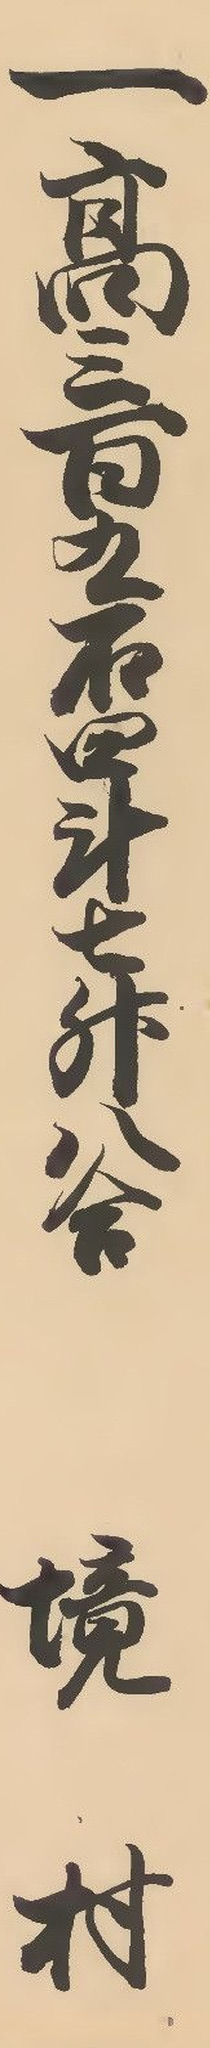一高三百九石四斗七升八合境村
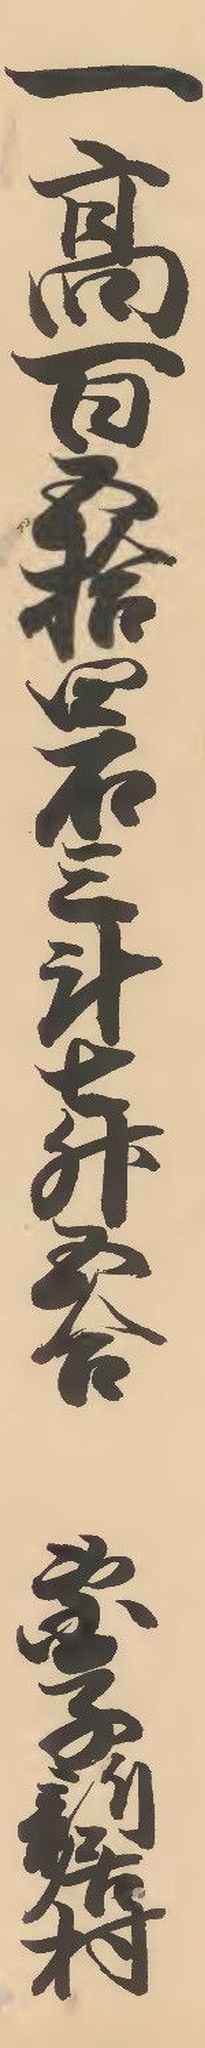一高百五拾四石三斗七升五合団子新居村
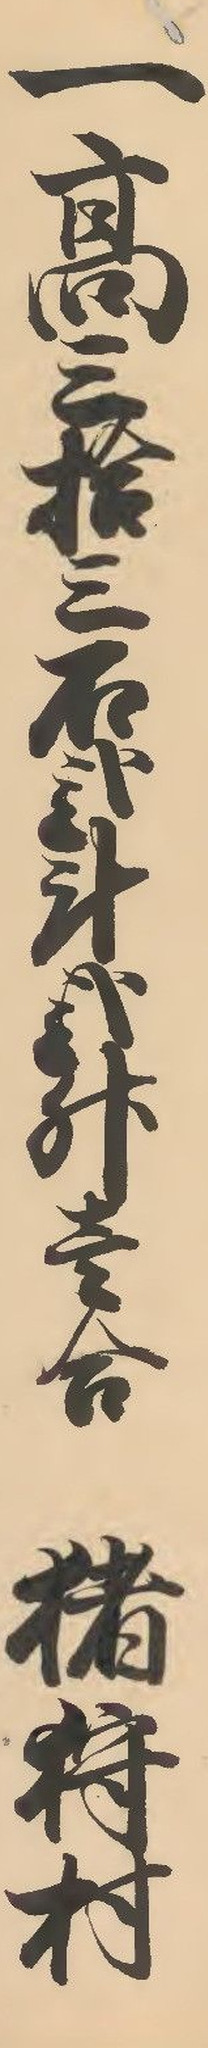一高三拾三石弐斗弐升壱合猪狩村
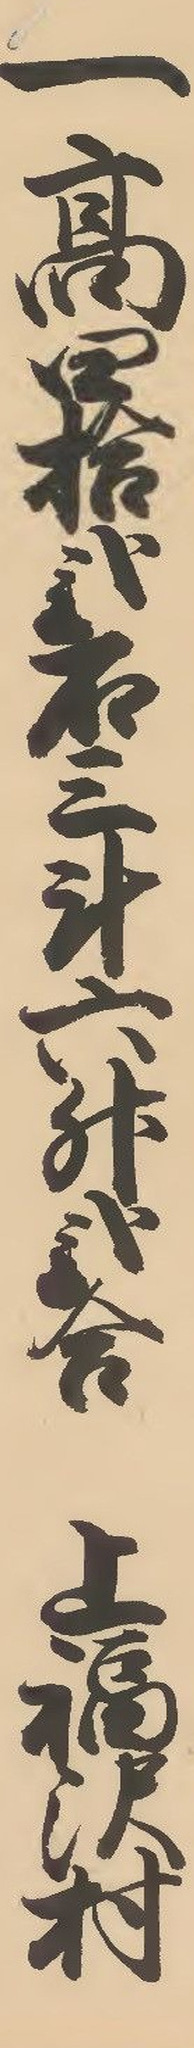一高四拾弐石三斗六升弐合上福沢村
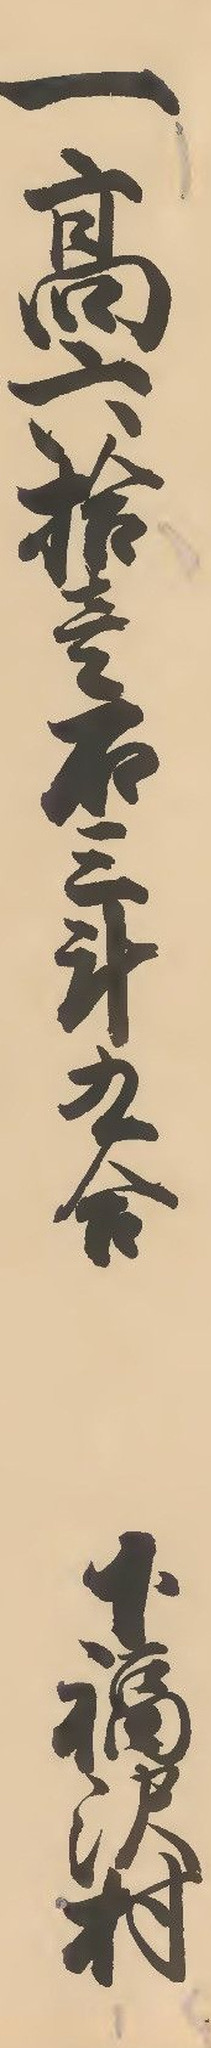一高六拾壱石三斗九合下福沢村
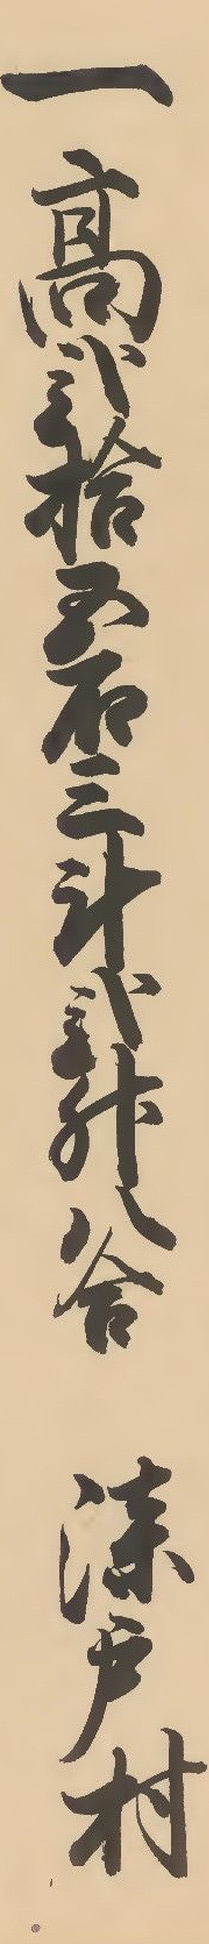一高弐拾五石三斗弐升八合漆戸村
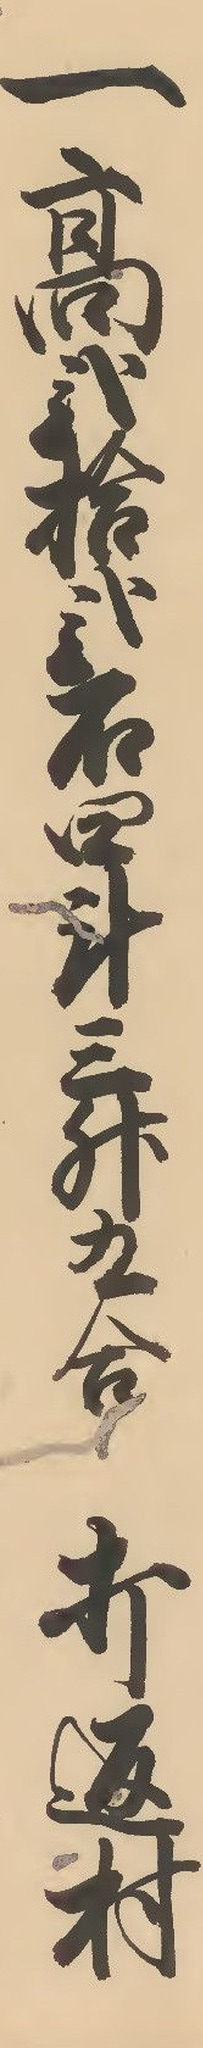一高弐拾弐石四斗三升九合打返村

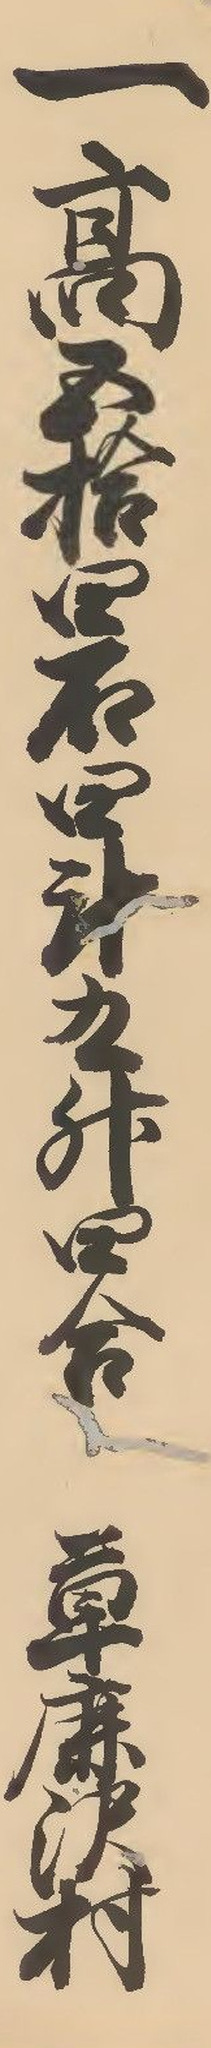一高五拾四石四斗九升四合草鹿沢村
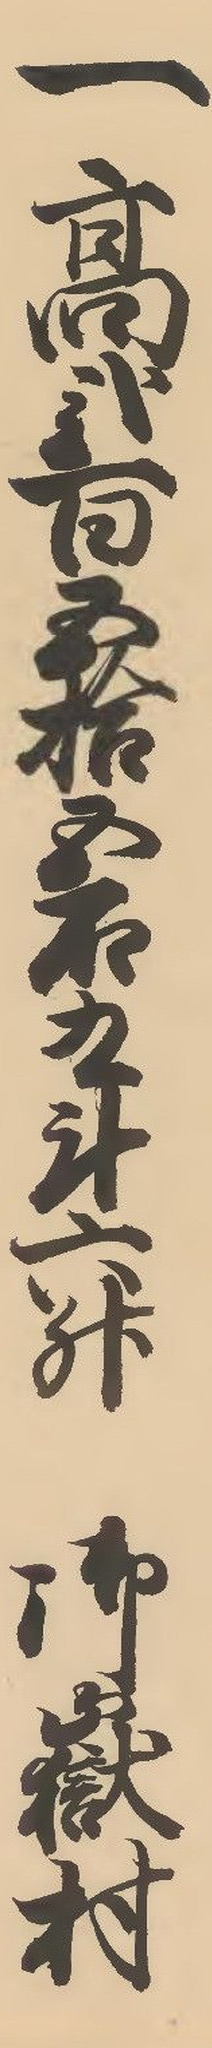一高弐百五拾五石九斗六升御岳村
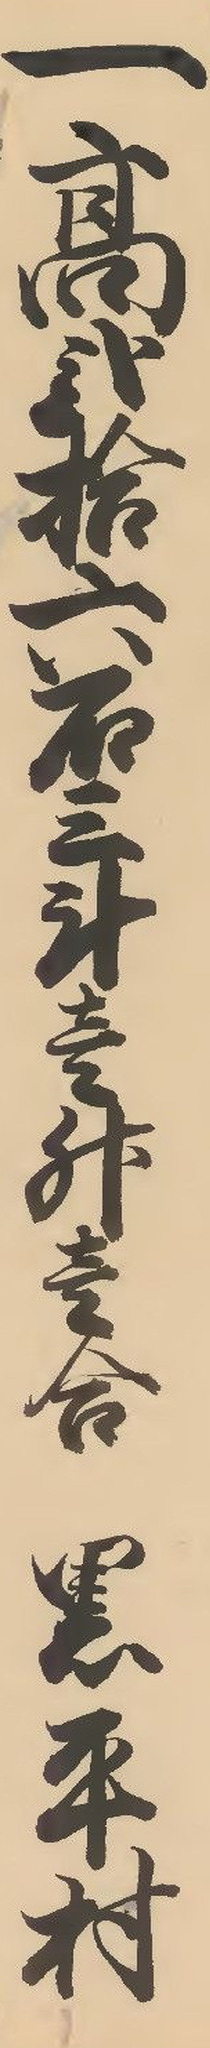一高弐拾六石三斗壱升壱合黒平村
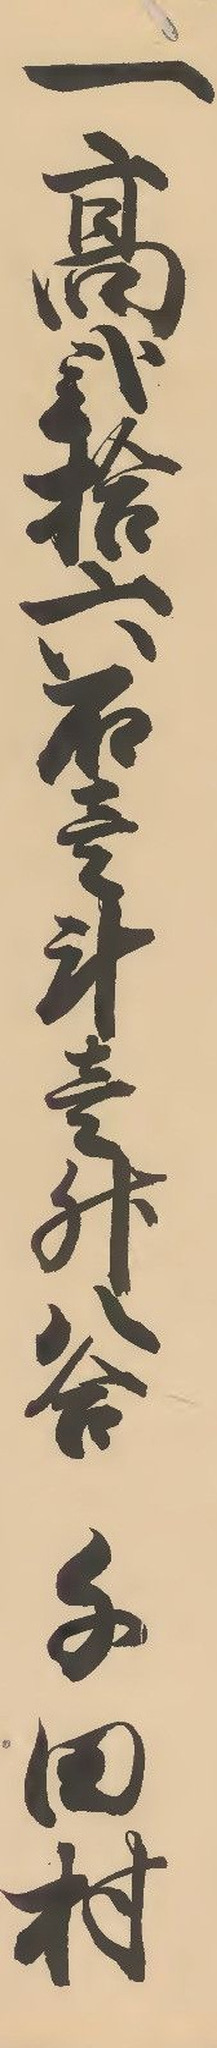一高弐拾六石壱斗壱升八合千田村
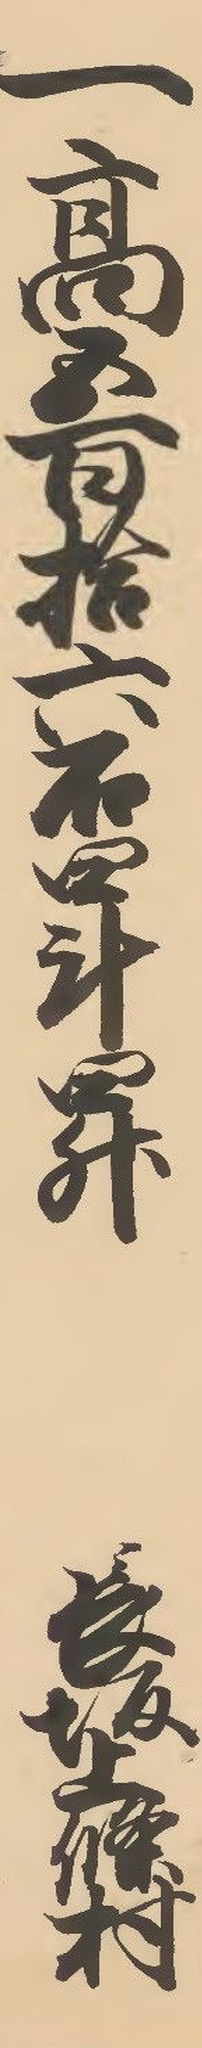一高五百拾六石四斗四升長坂上条村
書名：甲斐国郷帳
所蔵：国立公文書館 National Archives of Japan
